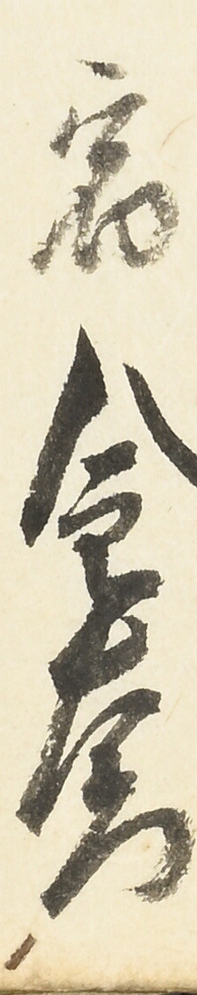宿金右衛門
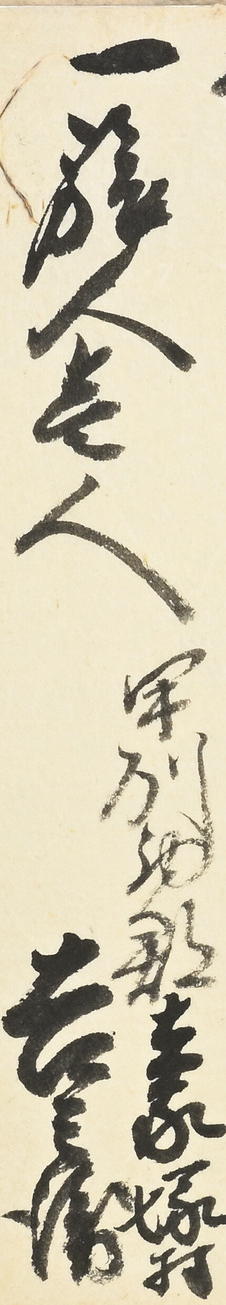一旅人壱人吉兵衛
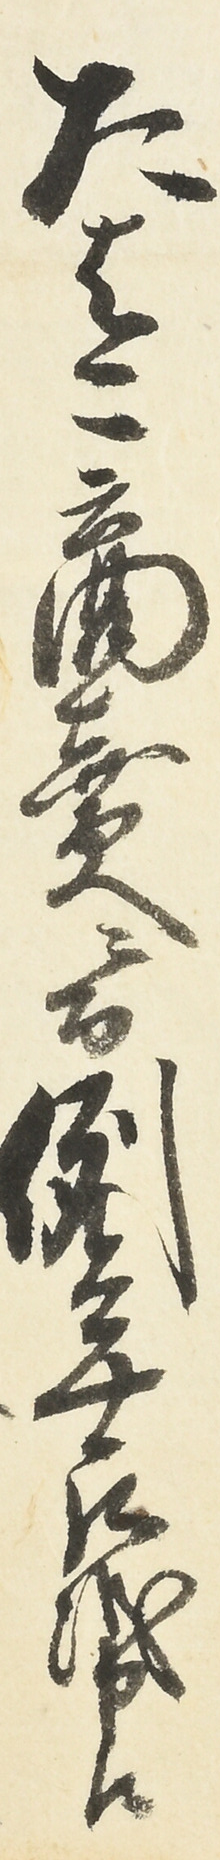たはこ商売ニ而例年罷越申候
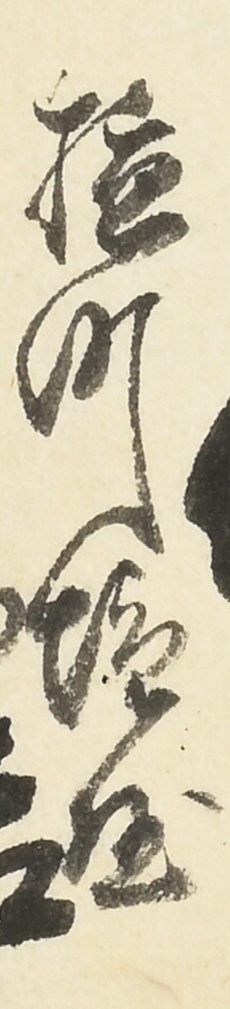横町塩屋
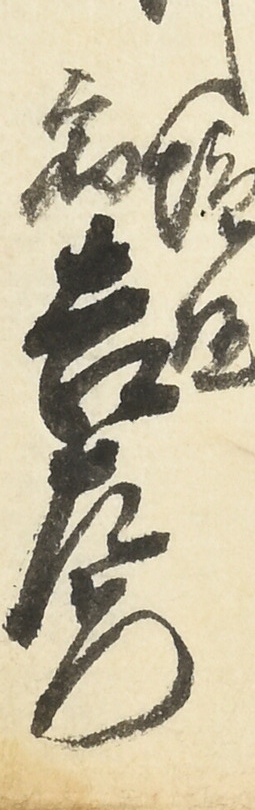宿吉左衛門

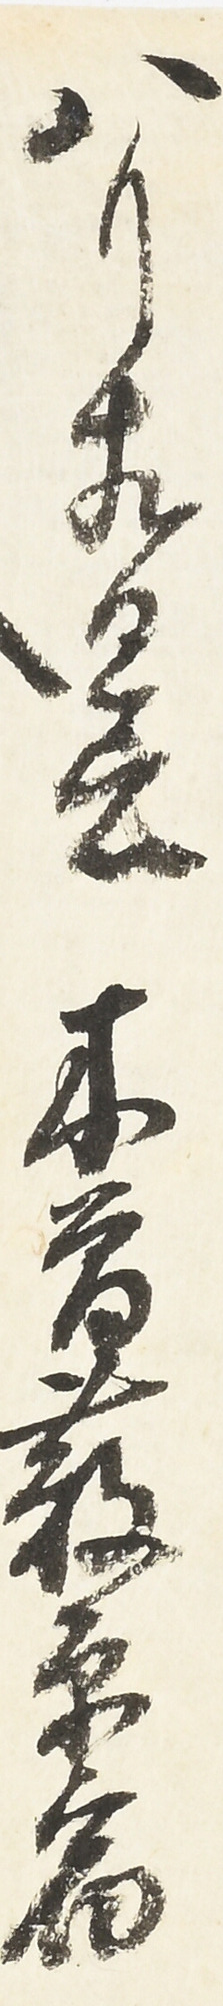八月十九日着木曽藪原宿
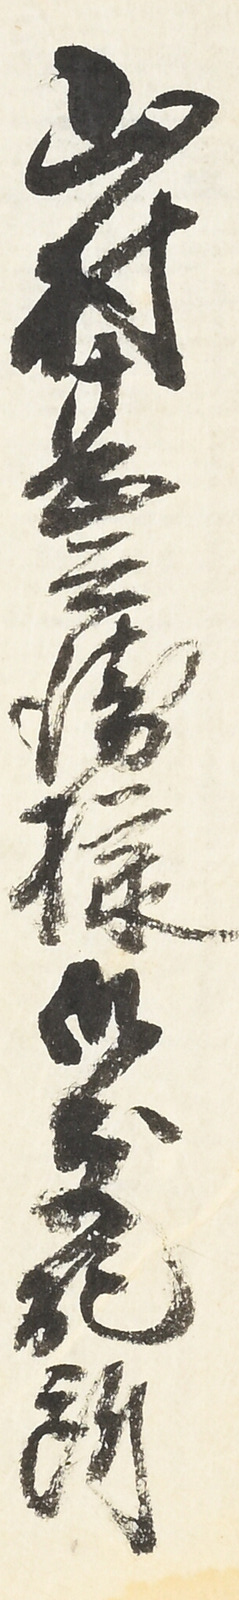山村甚兵衛様御支配所
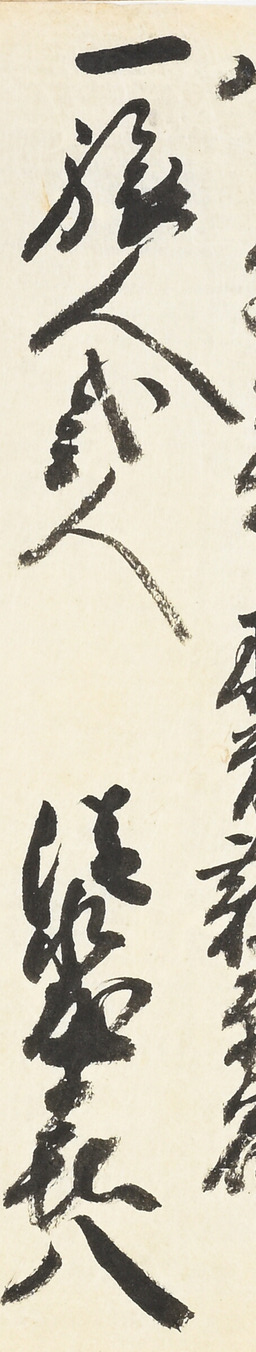一旅人弐人清水屋喜八
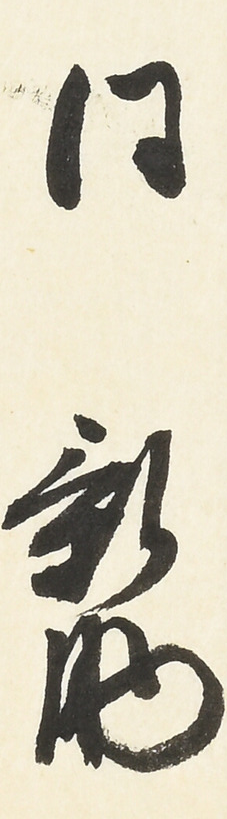同新助
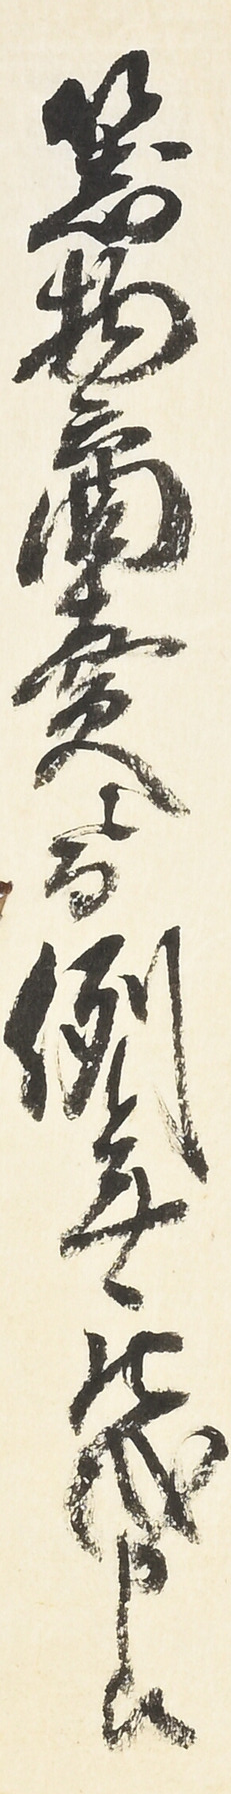器物商売ニ而例年罷越申候
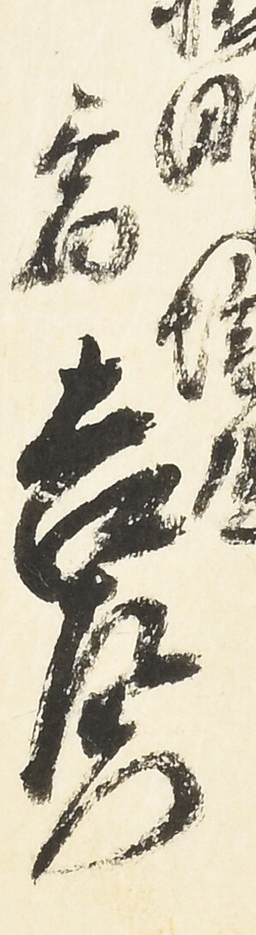宿吉左衛門
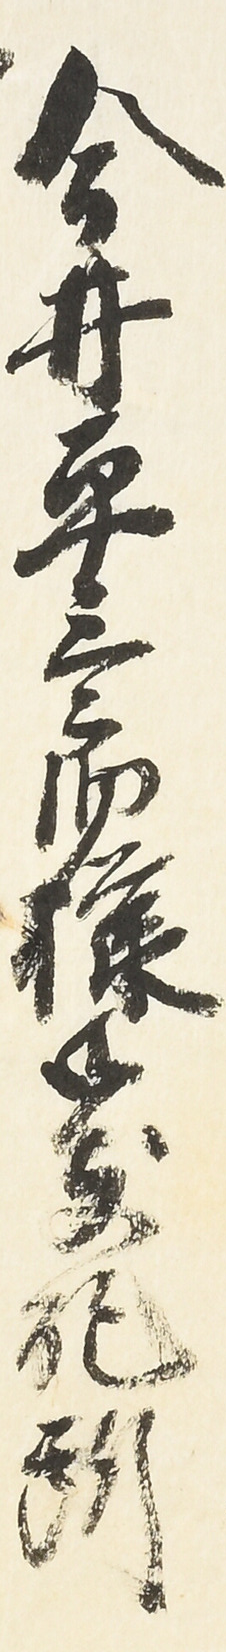今井平三郎様御支配所
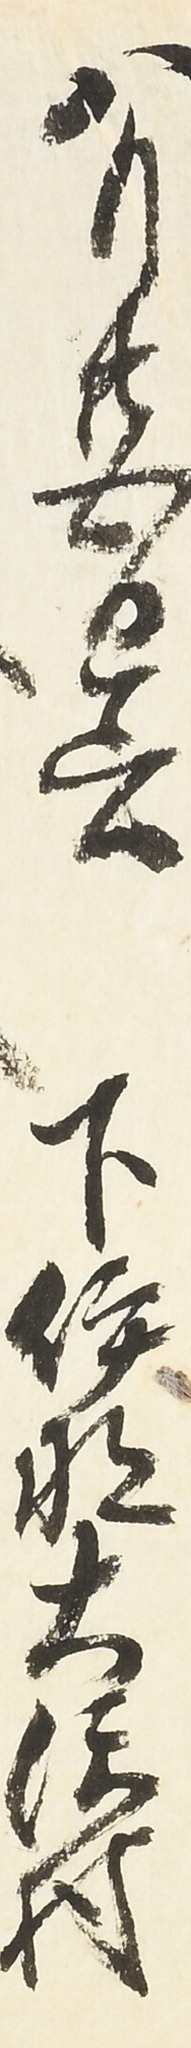八月廿五日着下伊那大沢村
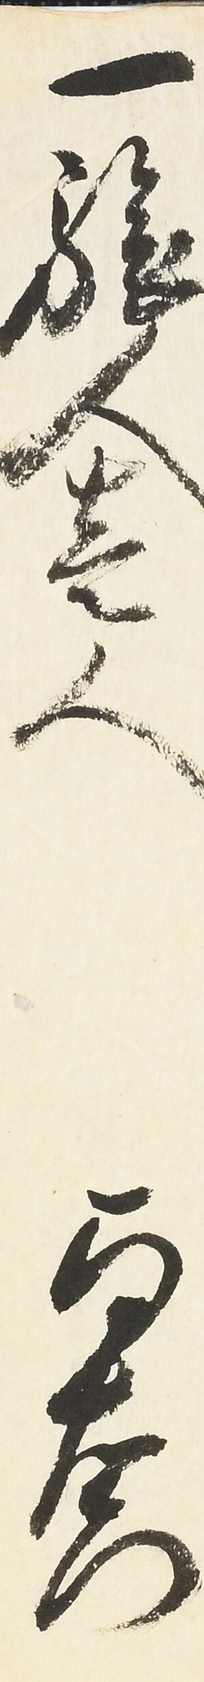一旅人壱人与右衛門
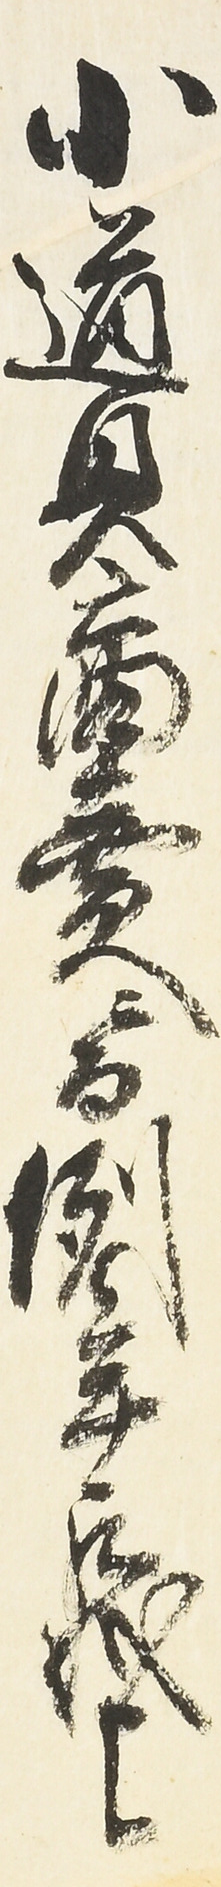小道具商売ニ而例年罷越申候
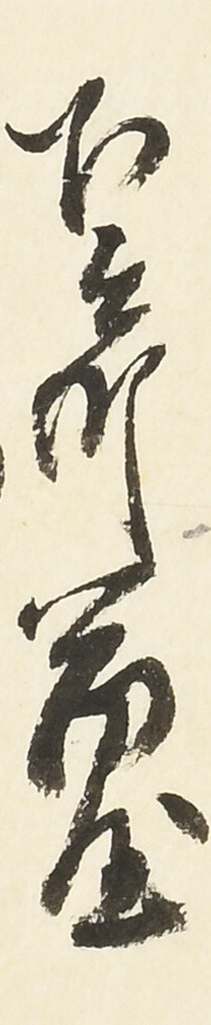下モ町冨屋
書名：町中旅人泊控帳
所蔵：伊那市立高遠町図書館・合同会社AMANE
